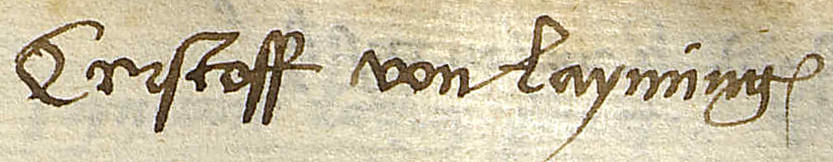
Criſtoff von Layning*
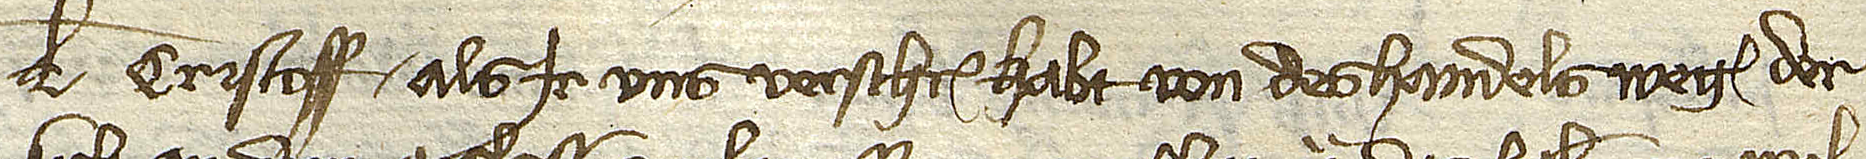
L* Criſtoff / als Ir vns verſchr* habt von des handels weg* der
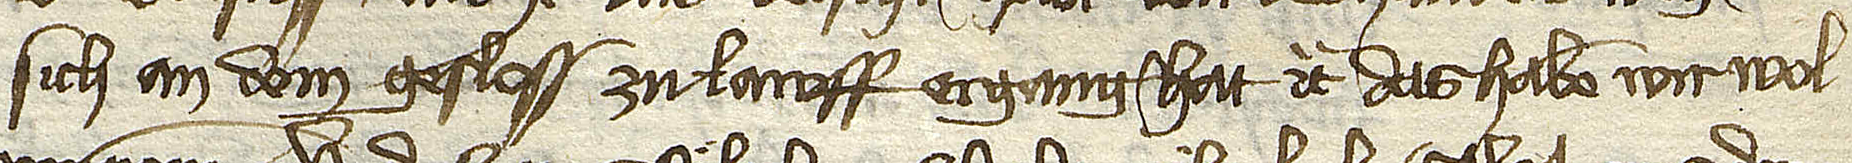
ſich an dem geſloſſ ʒu lawff ergang* hat ec* das habe* wir wol
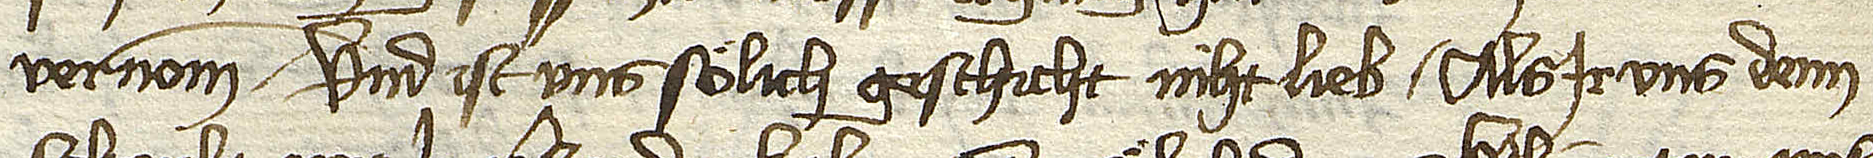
vernom* / Vnd iſt vns ſölich geſchicht niht lieb / Als Ir vns denn
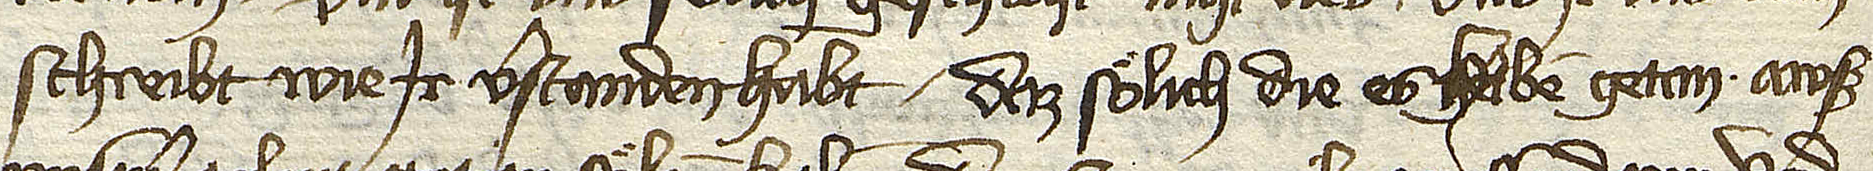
ſchreibt wie Ir v*ſtanden habt / daʒ ſölich die es habe* getan . awſʒ
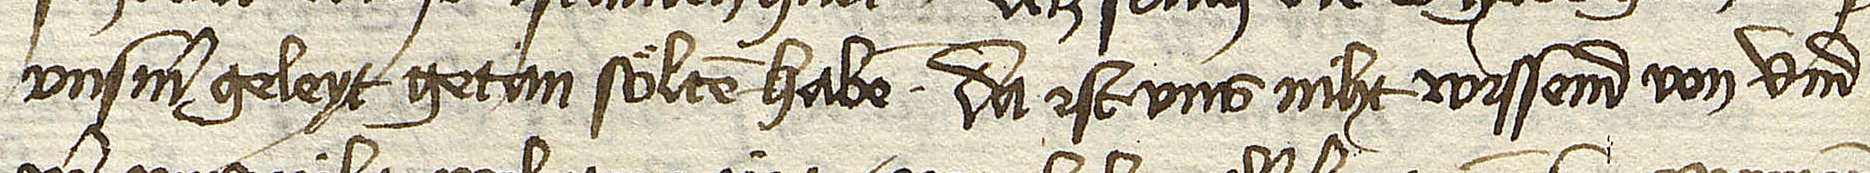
vnſm* geleyt getan ſölte* habe* . Da iſt vns niht wiſſend von Vnd
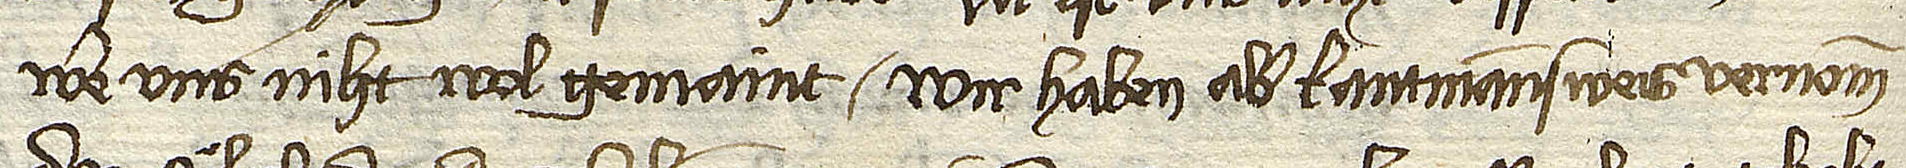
we* vns niht wol gemaint / wir haben ab* lantman*ſweis vernom*
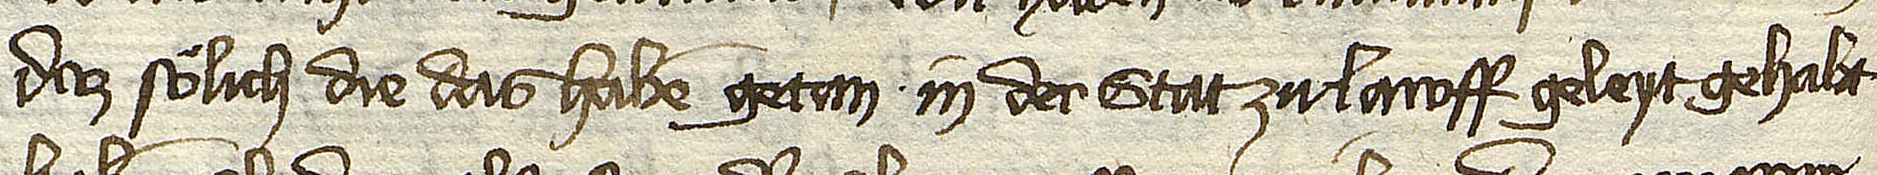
daʒ ſölich die das habe* getan . in der Stat ʒu lawff geleyt gehabt
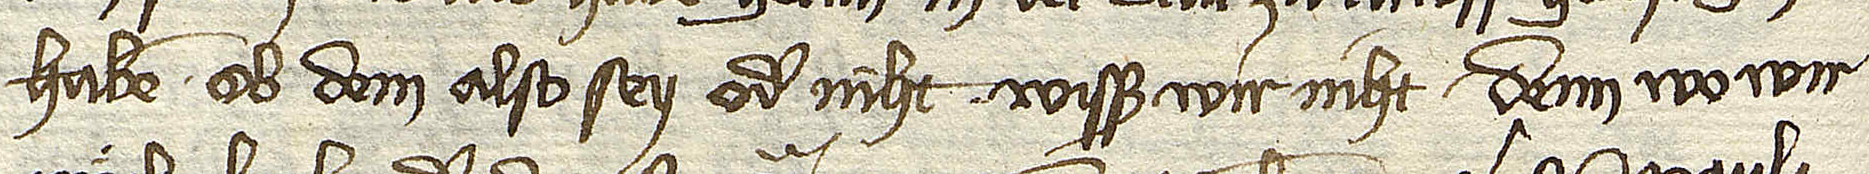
habe* . Ob dem alſo ſey od* niht wiſſ* wir niht / Denn wo wir
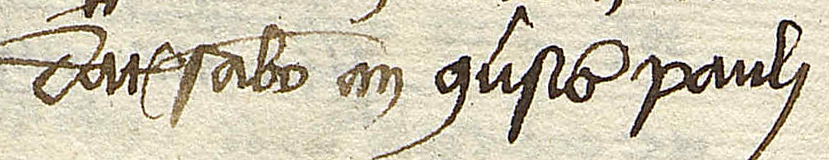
Dat* ſabo* an* *uſio* Pauli
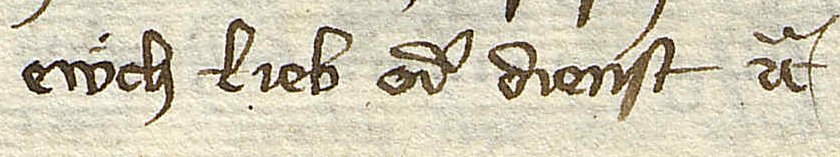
eẅch lieb od* dienſt ec*
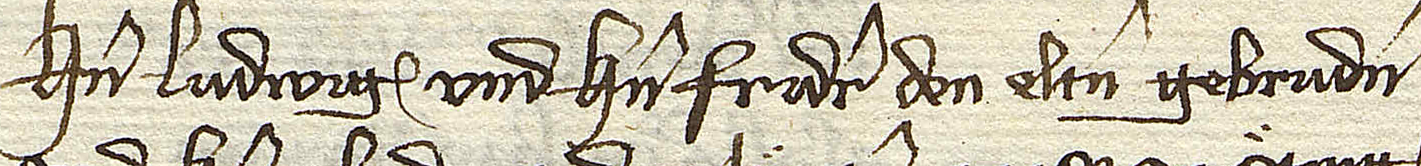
Hn* Ludwig* vnd Hn* Fridr* den eltn* gebrudn*
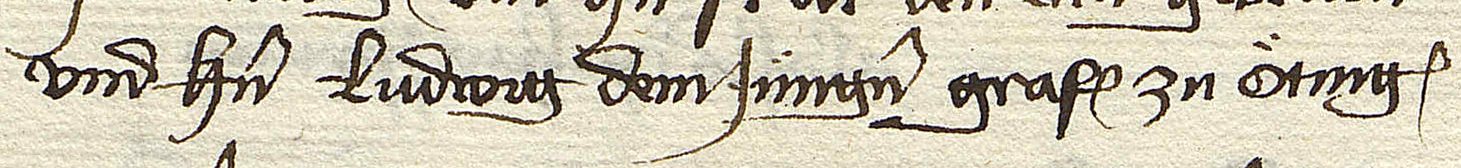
vnd Hn* Ludwig dem Iüngn* graf* ʒu Öting*
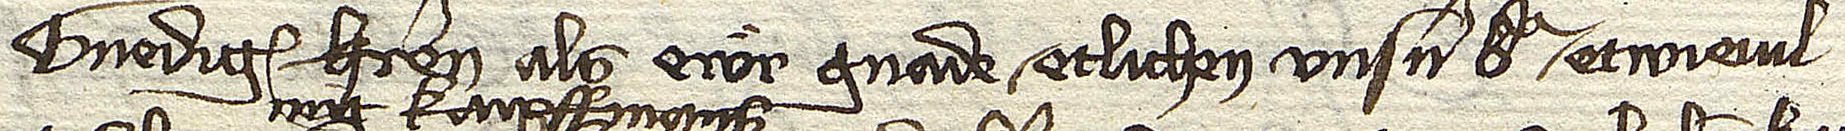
Gnedig* Hr*en als ewr gnade / etlichen vnſn* b* etwieuil
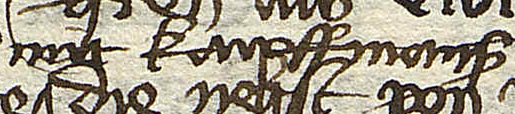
mit kawffmanſ*
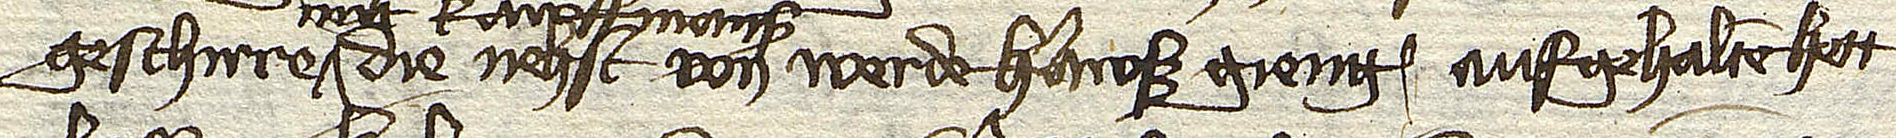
geſchirre die nehſt von werde h*auwſʒ gieng* aufgehalte* hett
